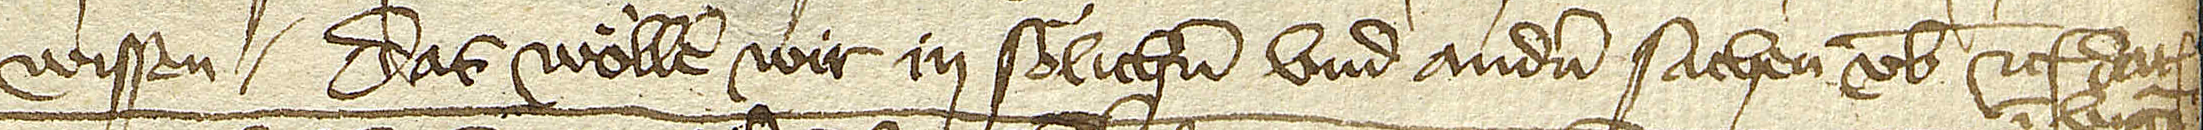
wiſſen / Das wölle wir in ſölichn* vnd andn* ſachen vb* ec* dat*
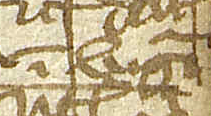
i* vigi*
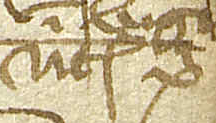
%%%* x*
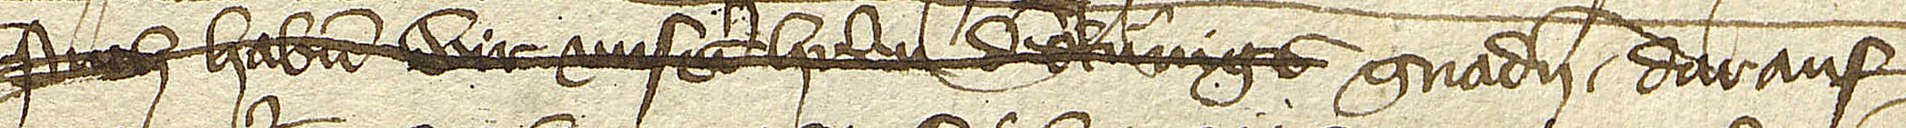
Auch habn* wir vnſer* hr*en des künigs gnadn* / darauf
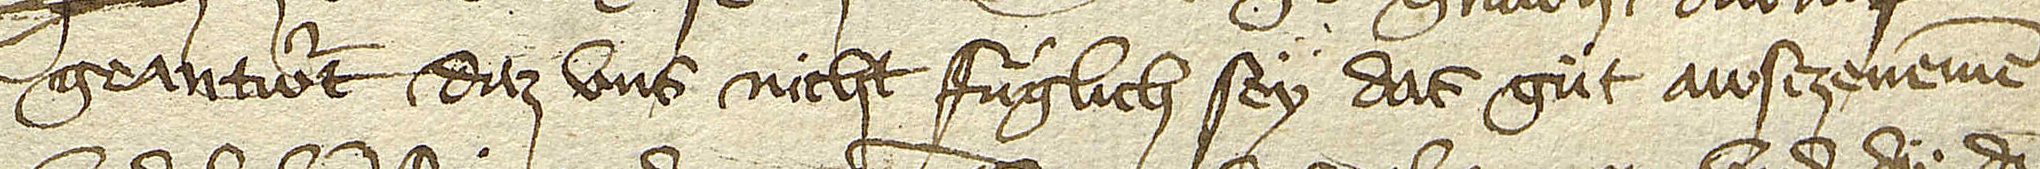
geantwt* / daʒ vns nicht füglich ſey das güt awſcʒeneme*
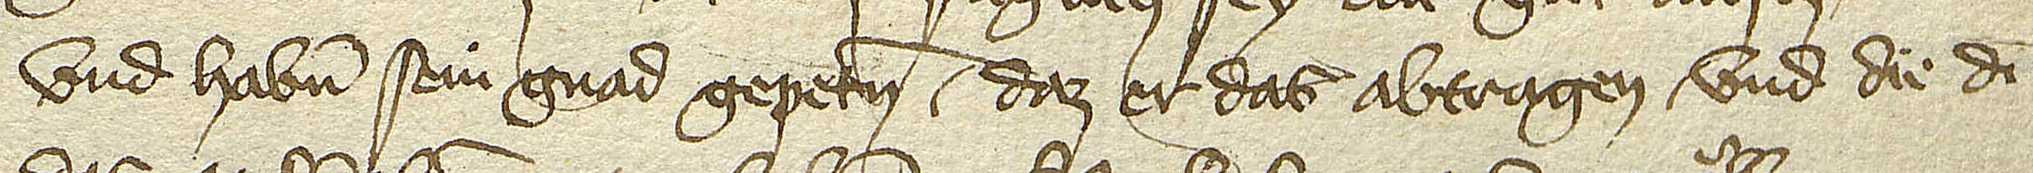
vnd habn* ſein gnad* gepetn* / daʒ er das abtragen / vnd die di
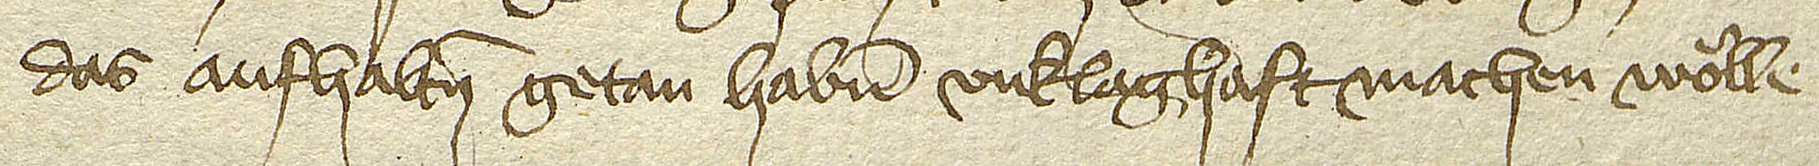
das aufhaltn* getan habn* vnklaghaft machen wölle
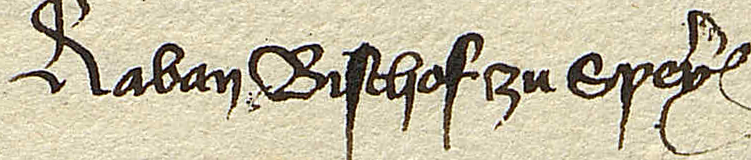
Raban Biſchof cʒu Spey*
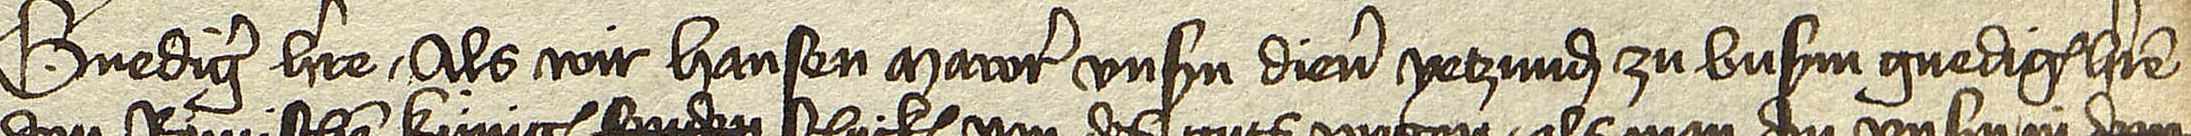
Gnedig h*re / Als wir hanſen Mawr* vnſ*n dien* yecʒund* cʒu vnſ*m gnedig* h*re*
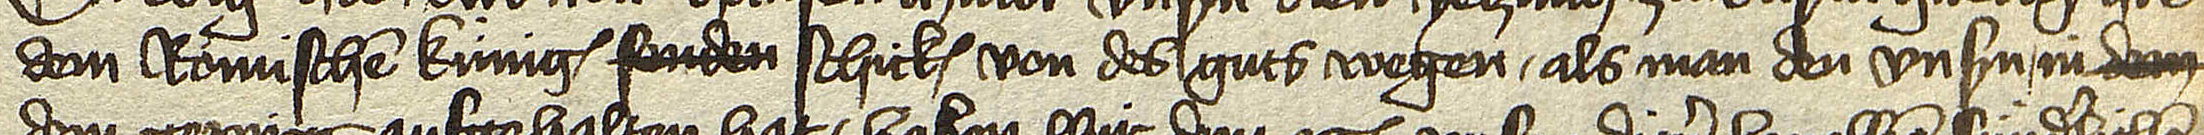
dem Römiſche* künig* ſenden ſchick* von des guts wegen / als man den vnſ*n in dem
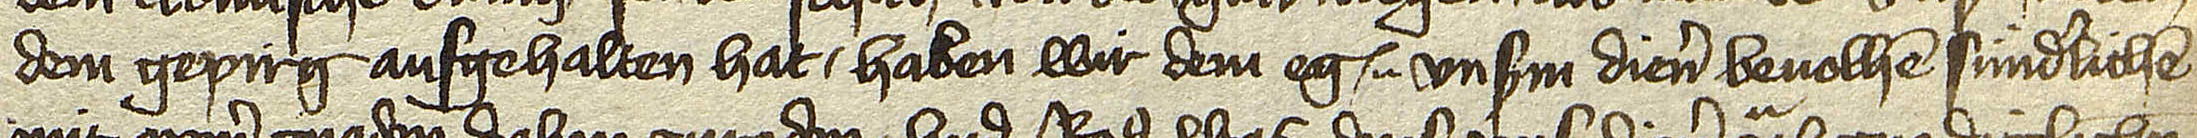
dem gepirg aufgehalten hat / haben wir dem eg* ~ vnſ*m dien* beuolhe* ſünd*liche*
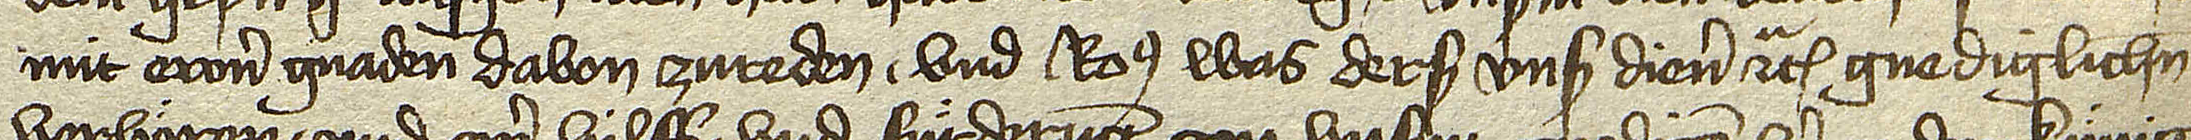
mit ewn* gnaden davon cʒureden / vnd Ro* was derſ* vnſ* dien* ec* gnediglichn*
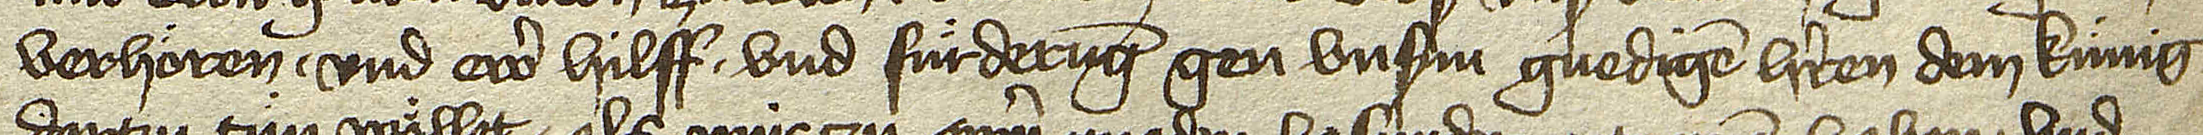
verhören / vnd ew* hilff / vnd fürderug* gen vnſ*m gnedige* hr*en dem künig*
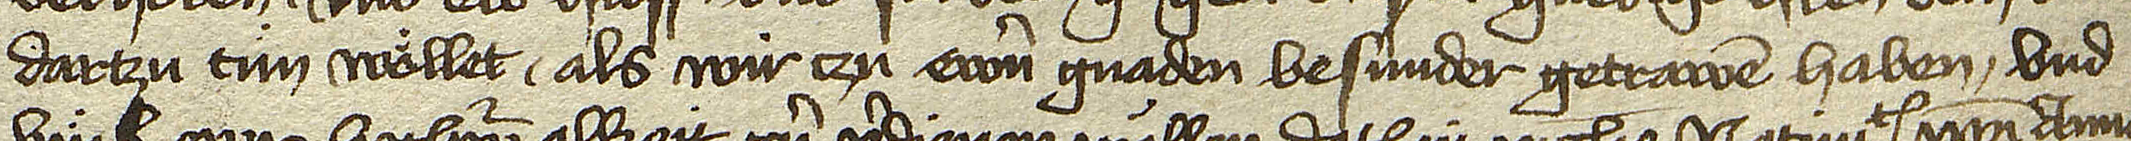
dartʒu tün wöllet / als wir cʒu ewn* gnaden beſunder getrawe* haben / vnd
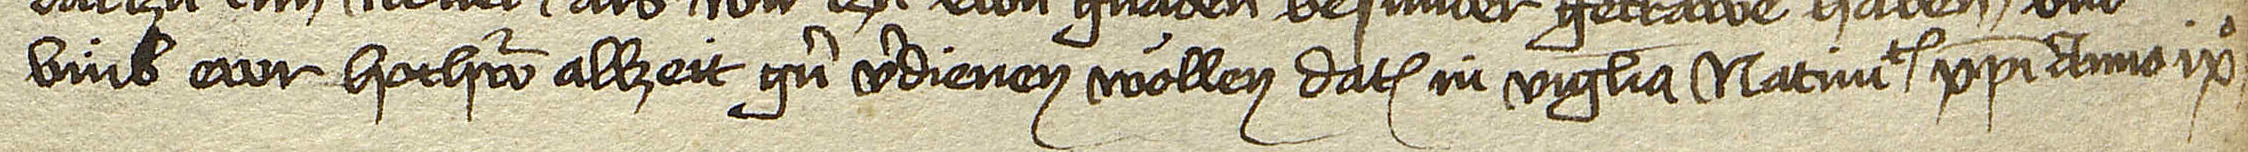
vmb ewr hochw* allʒeit gn* v*dienen wöllen dat* in viglia* Natiui* xpi* Anno ix*
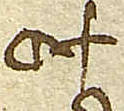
%%
